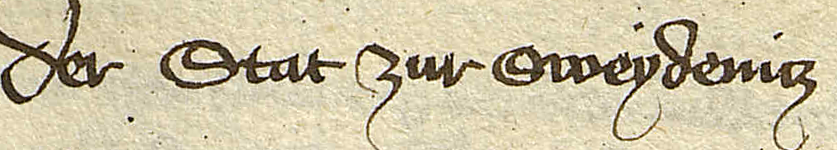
der Stat cʒur Sweydenicʒ
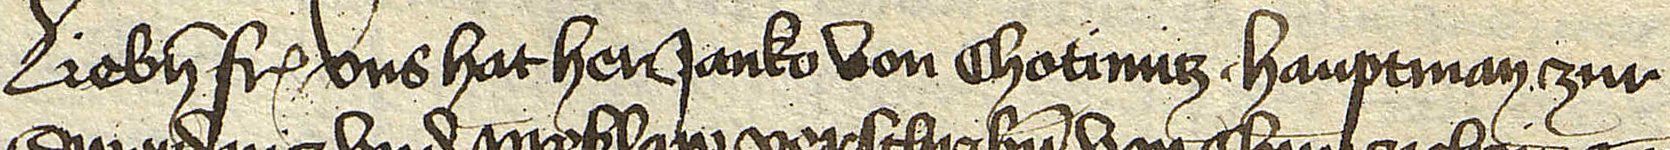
Liebn* fr* / vns hat her Ianko von Chotimicʒ / hauptman cʒur
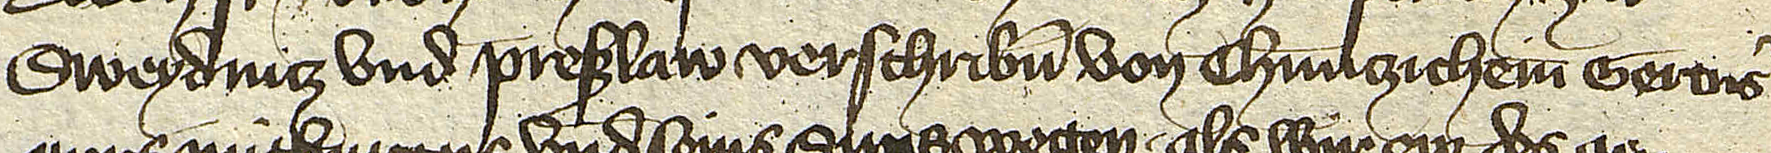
Sweydnicʒ vnd preſʒlaw verſchribn* von Chuncʒichein Gertns*
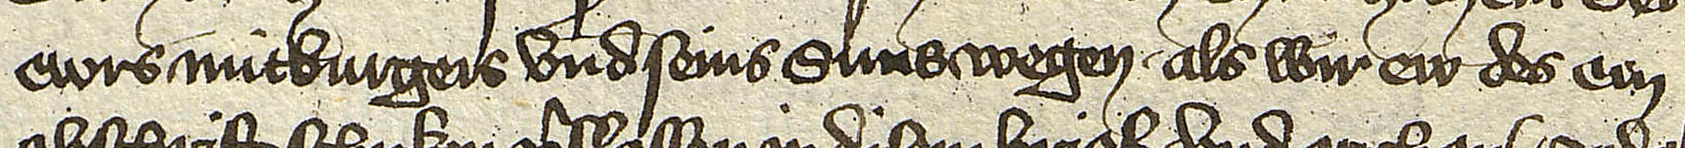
ewrs mitburgers vnd ſeins Suns wegen / als wir ew des ein
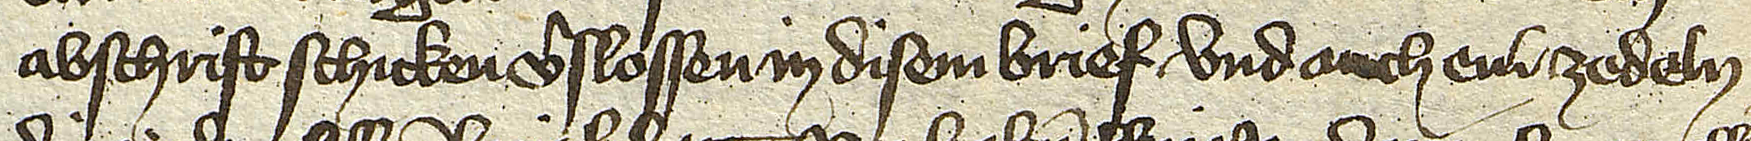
abſchrift ſchicken v*ſloſſen in diſem brief / vnd auch ein* cʒedeln
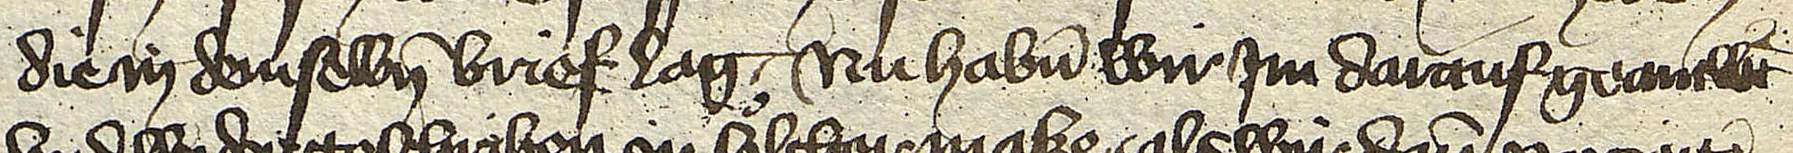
die in demſelbn* brief lag / Nu habn* wir Im darauf geantwt*
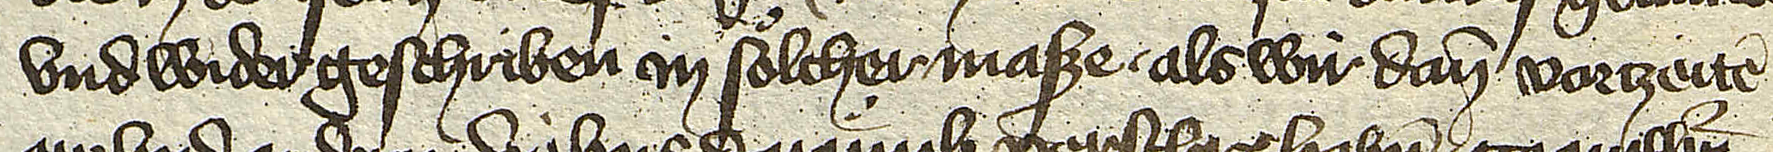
vnd wider geſchriben in ſölicher maſʒe / als wir dan* vorcʒeite*
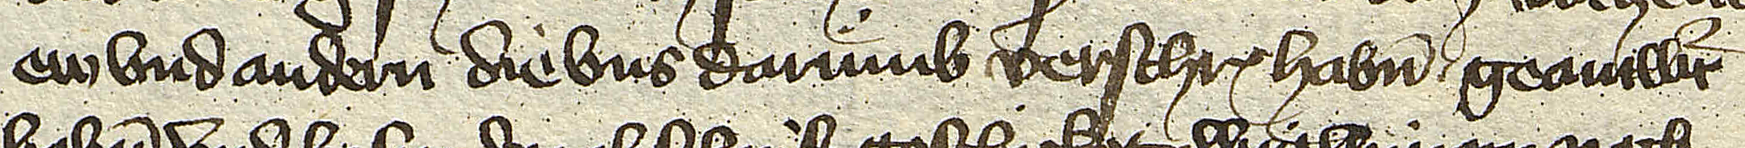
ew vnd andern die vns darümb verſchr* habn* / geantwt*
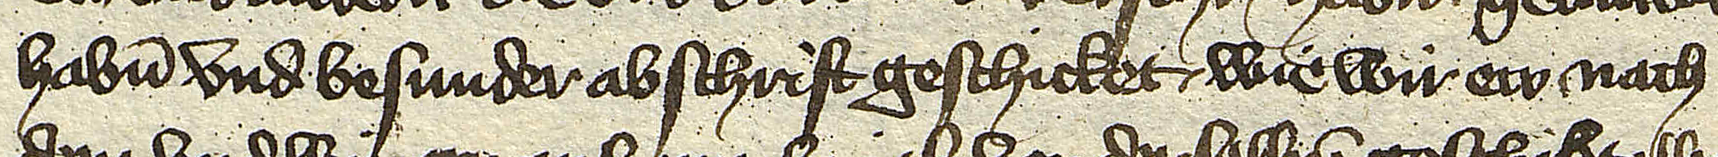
habn* vnd beſunder abſchrift geſchicket / wie wir ew nach
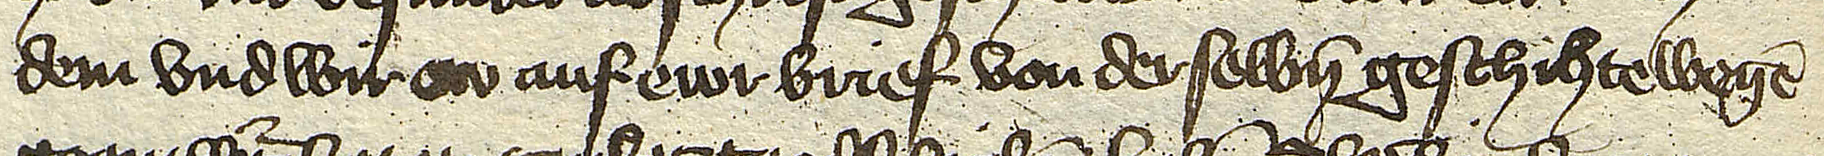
dem vnd wir ew auf ewr brief von derſelbn* geſchihte wege*
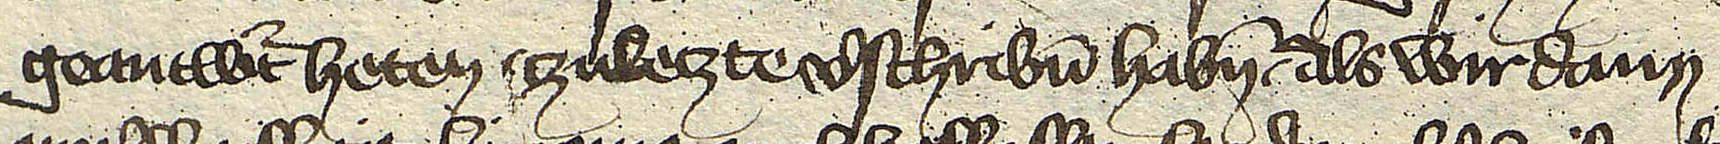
geantwt* heten / cʒulecʒte v*ſchribn* habn* / Als wir dann
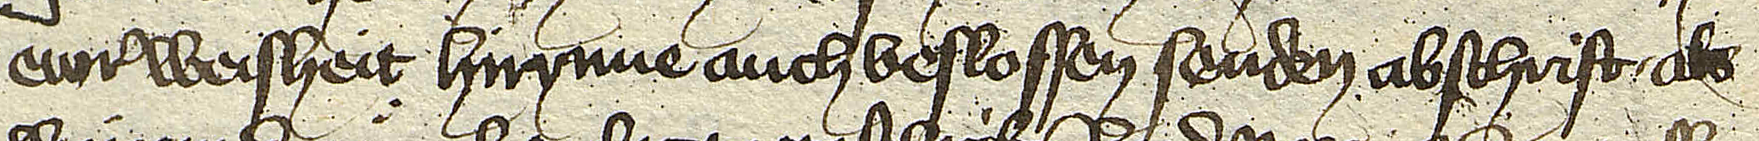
ewr* weiſheit hirynne auch beſloſſen ſenden abſchrift / als
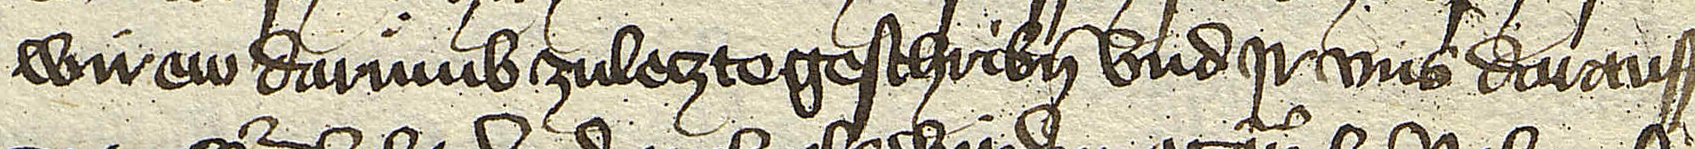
wir ew darümb cʒulecʒte geſchribn* vnd Ir vns darauff
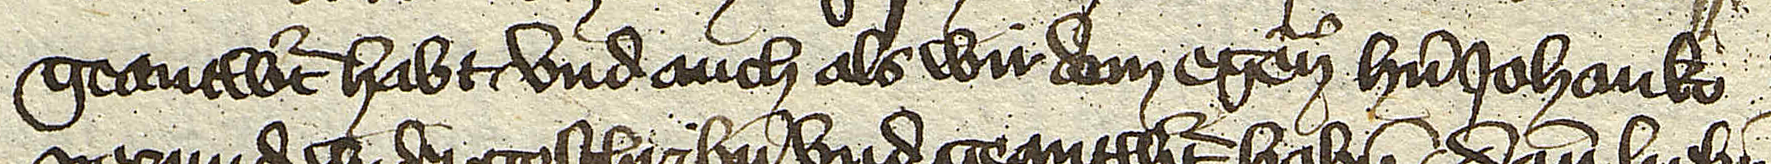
geantwt* habt / vnd auch als wir dem egen* hn* Iohanko
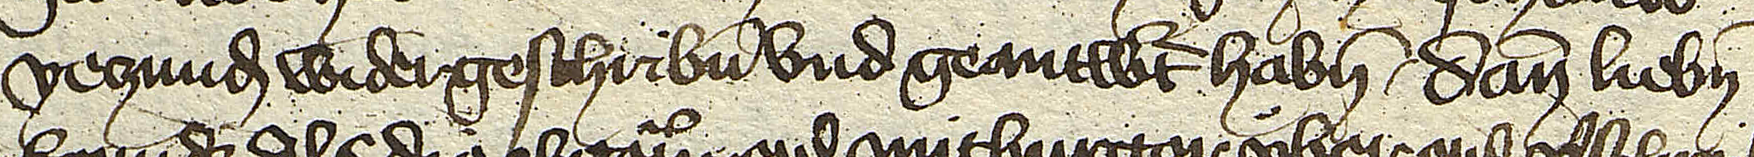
yecʒund wider geſchribn* vnd geantwt* habn* / dan* liebn*
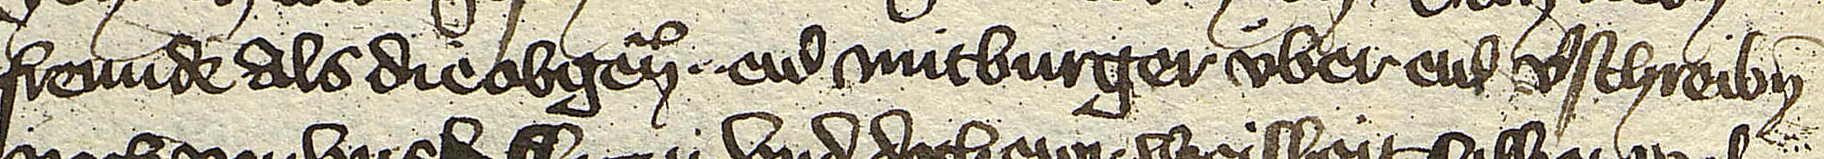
freunde als die obgen* ~ ew* mitburger v̈ber ew* v*ſchreibn*
